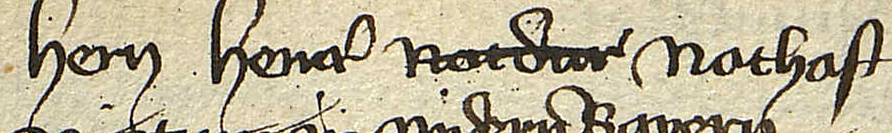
hern heinr* Notdur Nothaft
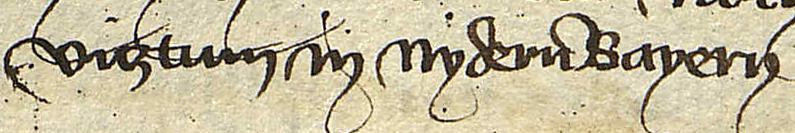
vicʒtum in Nydern Bayern
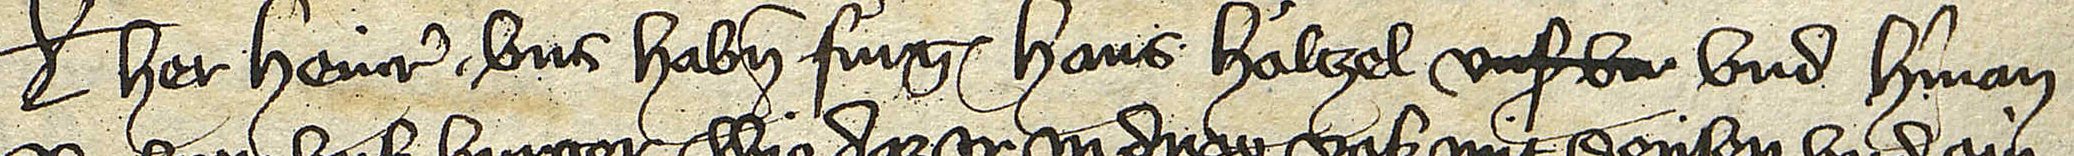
L* her heinr* / vns habn* fürg* hans hölcʒel vnſ* bu vnd h*man
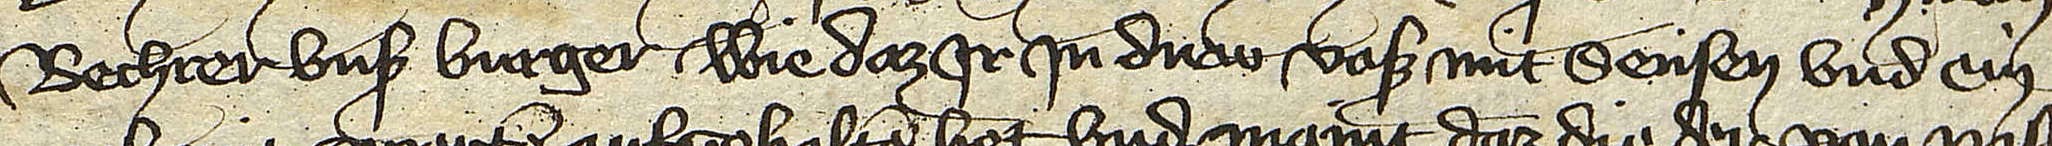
Bechrer vnſ* burger / wie daʒ Ir In drew vaſʒ mit Senſen vnd ein
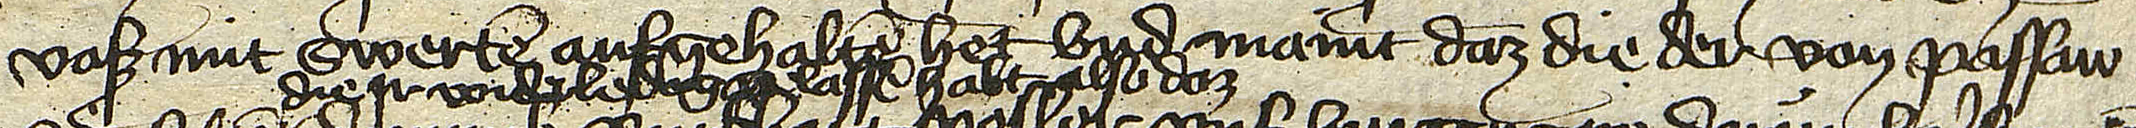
vaſʒ mit Swerte* aufgehalte* het vnd maint daʒ die der von Paſſaw
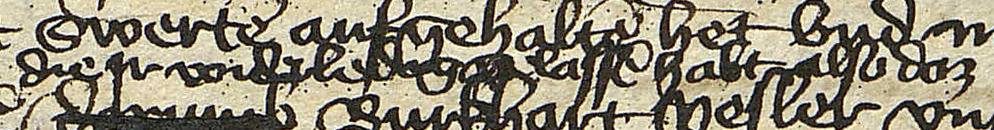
die Ir wider ledig gelaſſe* habt alſo daʒ
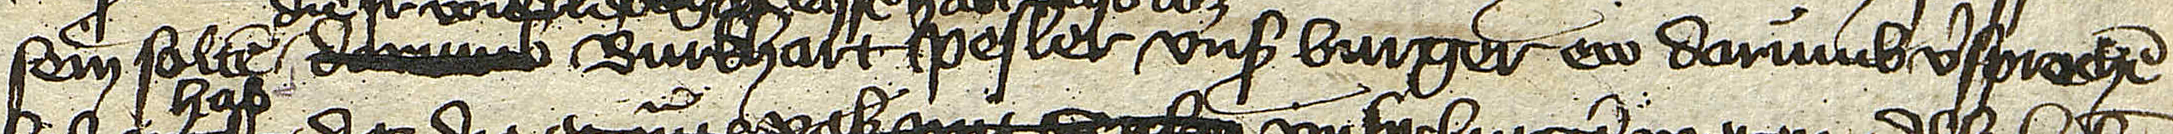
ſein ſolte* / darumb Burkhart Peſler vnſ* burger ew darümb v*ſproche*
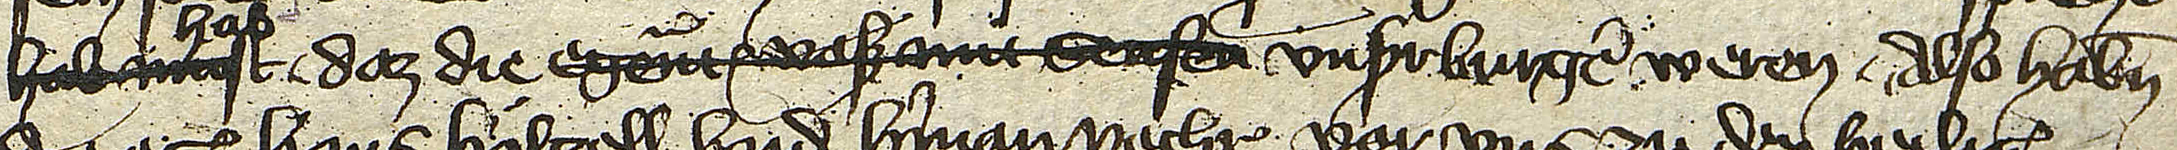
hab muſt / daʒ die egen*t* vaſʒ* mit Senſen vnſ*r burge* weren / Alſo habn*
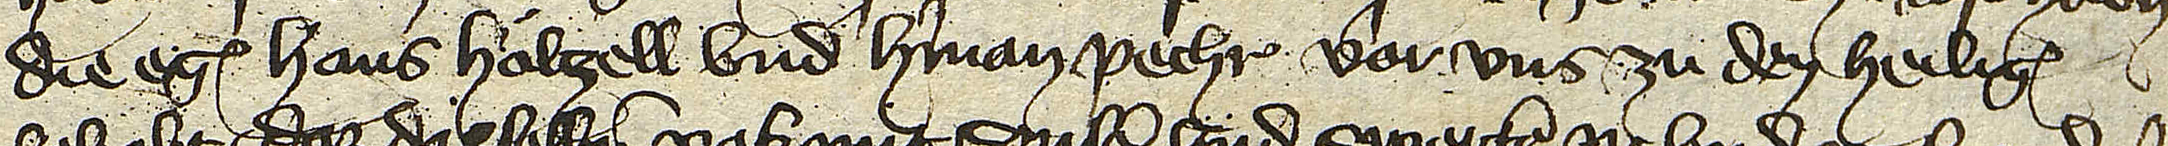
die eg* hans hölcʒel vnd h*man Pechr* vor vns cʒu den heilig*
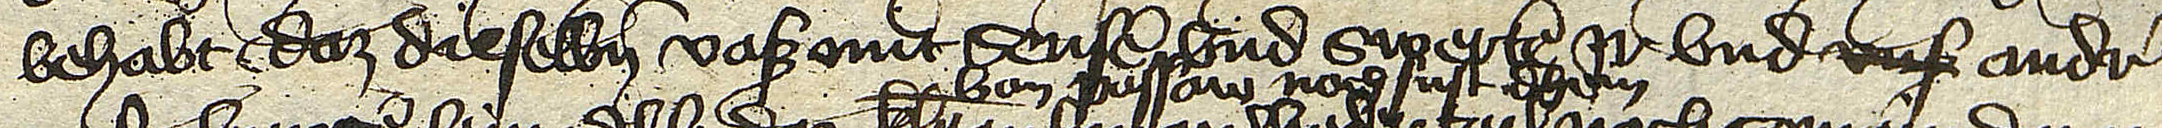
behabt / daʒ dieſelbn* vaſʒ mit Senſe* vnd Swerte* Ir vnd vnſ* andr*
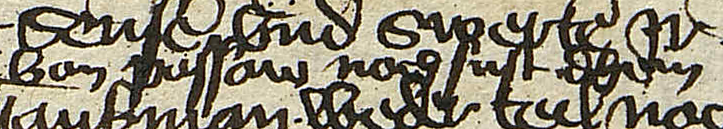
von Paſſaw noch ſuſt dhein
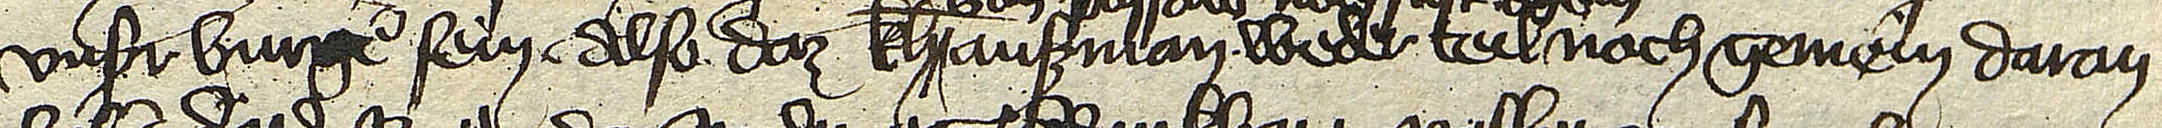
vnſ*r burge* ſein / Alſo daʒ kh* auſʒman weder teil noch gemein daran
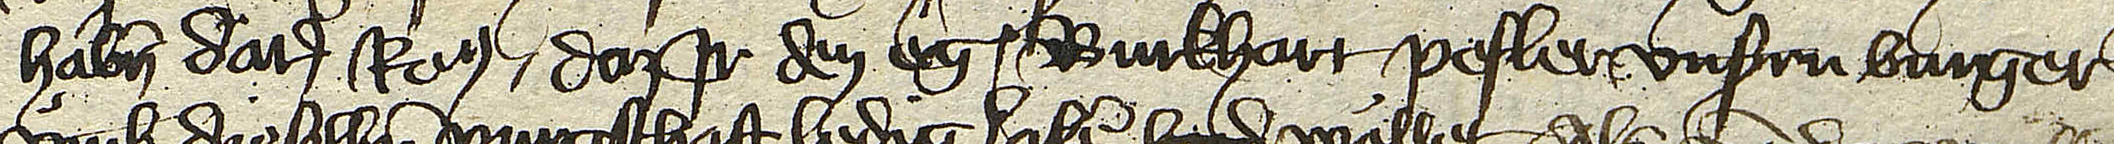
habn* dar* Ro* / daʒ Ir den eg* Burkhart Peſler vnſ*rn burger
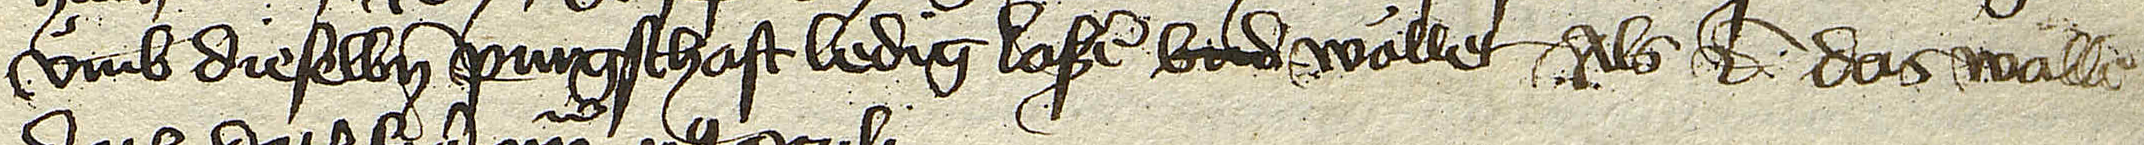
v̈mb dieſelbn* purgſchaft ledig laſʒe* vnd wöllet / Als ec* das wölle
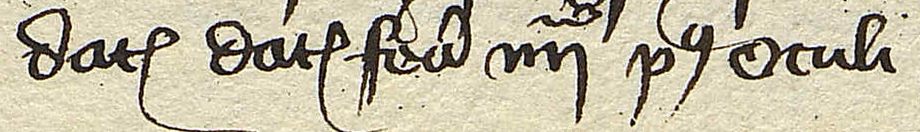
dat* dat* fea* iiii* p* Oculi
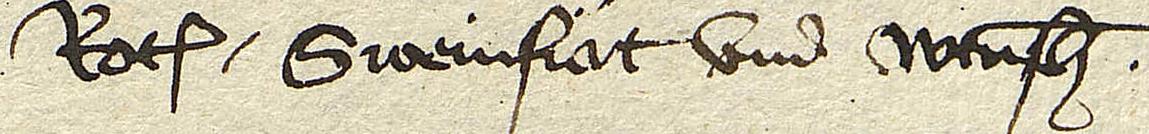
Rot* / Sweinfürt vnd winſh*
